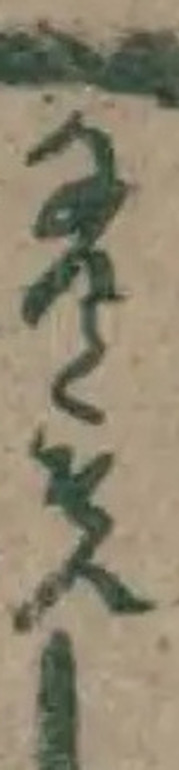なんとそん
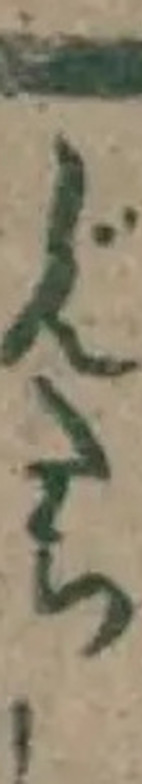じんたち
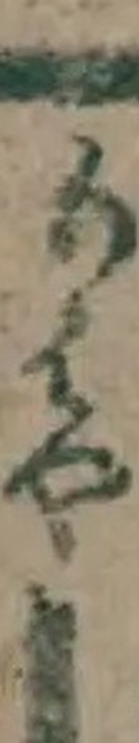もはや
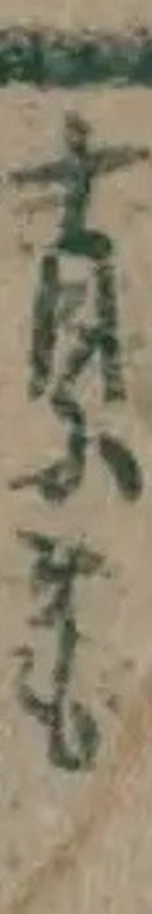十月にまも
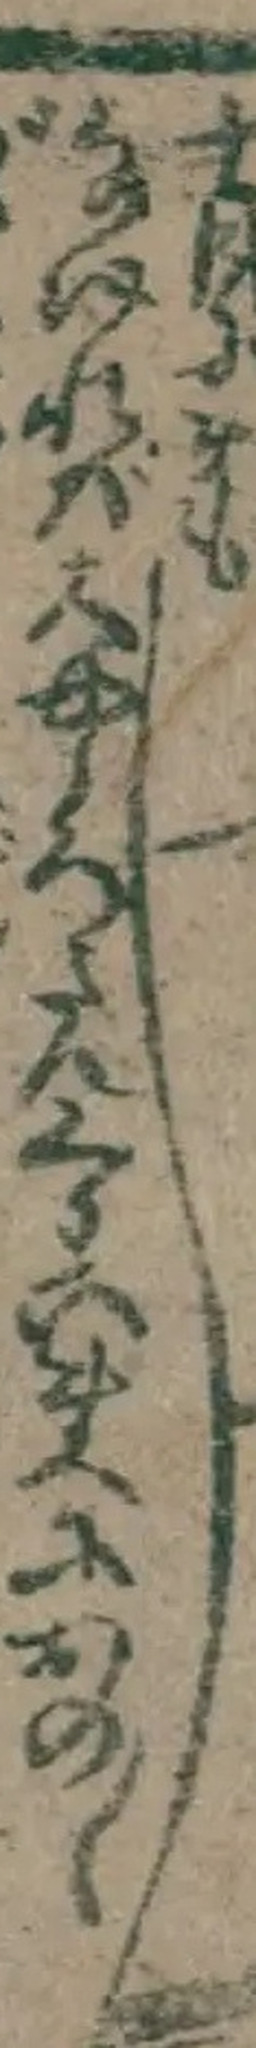なければ大やしろさんくわいまへにおの〳〵
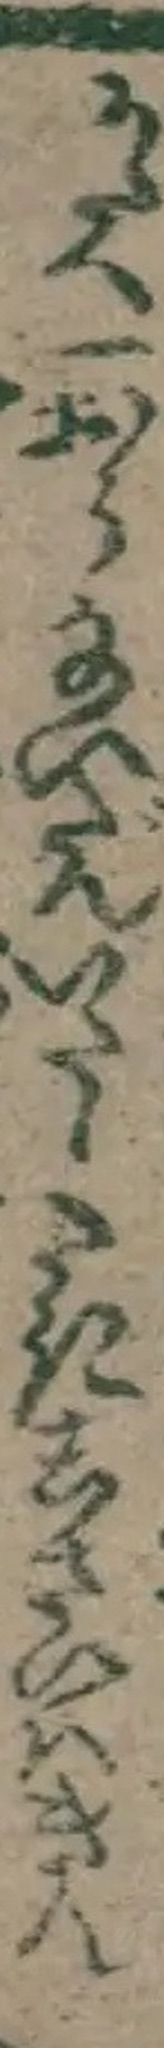がたへ一おうないだんいたしたきしさいはきん
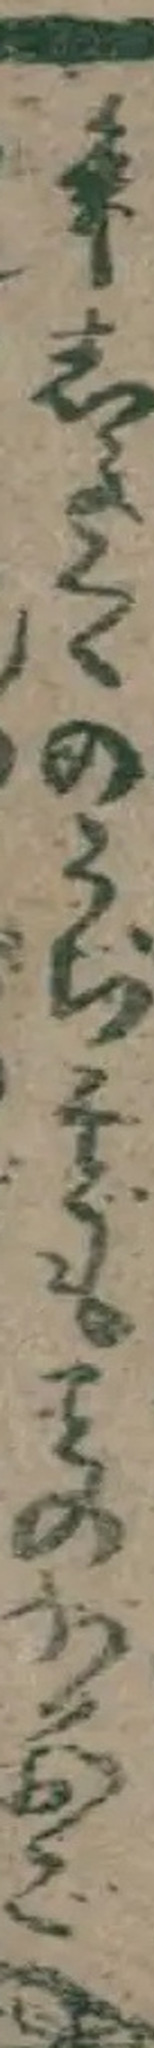年しよこくのうぢこどもことのほかおごり
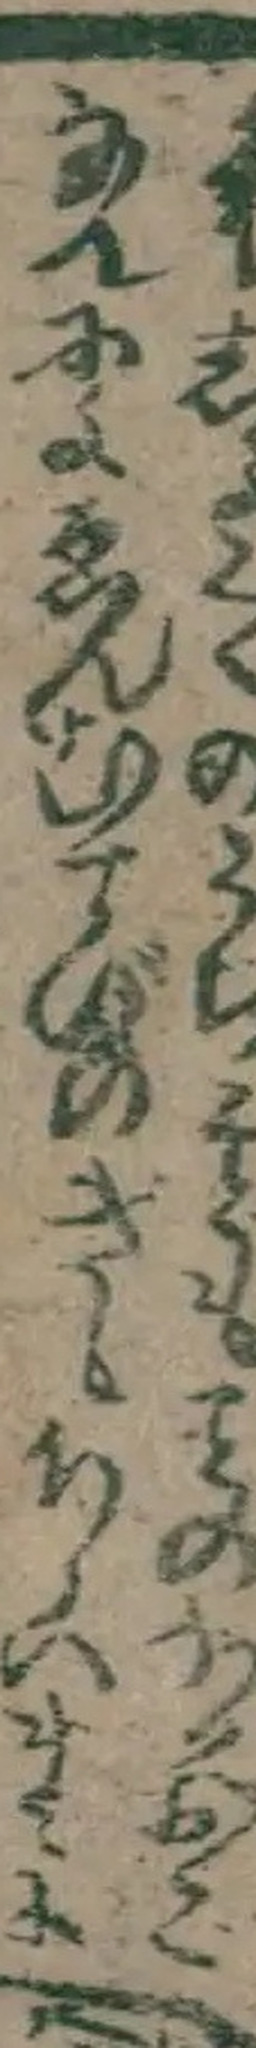なんによゑんむすびのきもほしいまゝになり
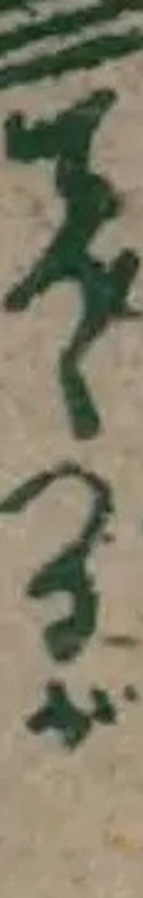てん〳〵つるが
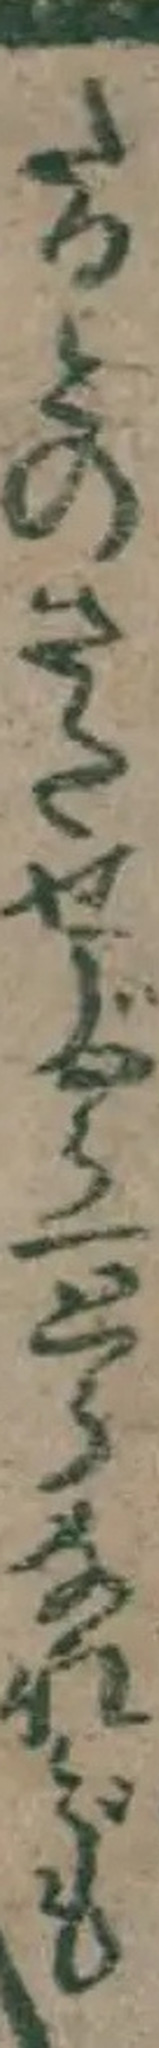たるとのさたせじやう一とうなれどもわけて
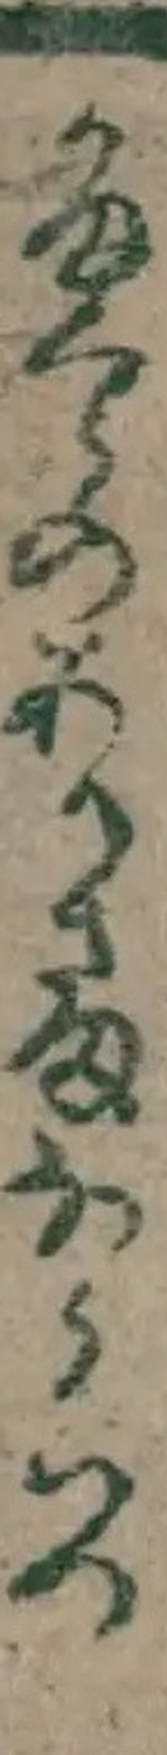かまくらのありさまほういつ
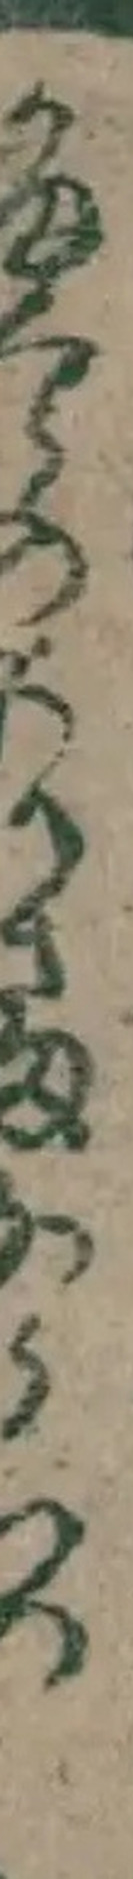かまくらのありさまほういつ
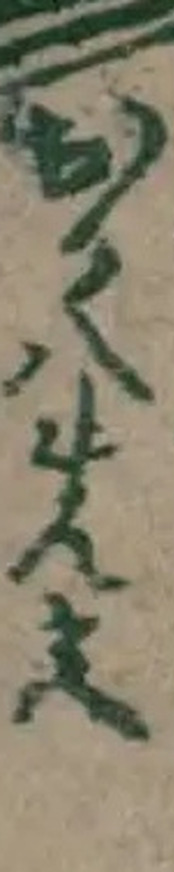おか八幡宮
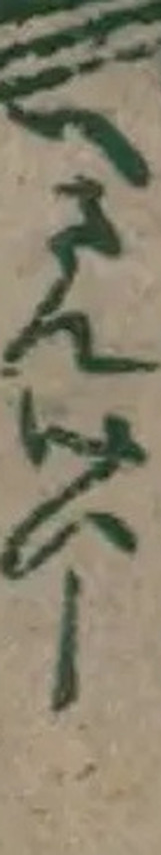へさんけいし
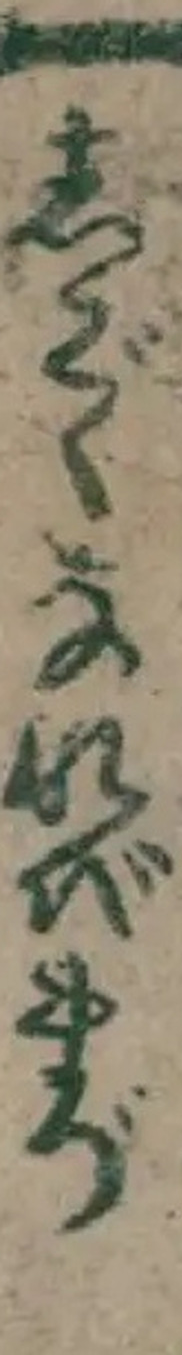しごくなればまづ
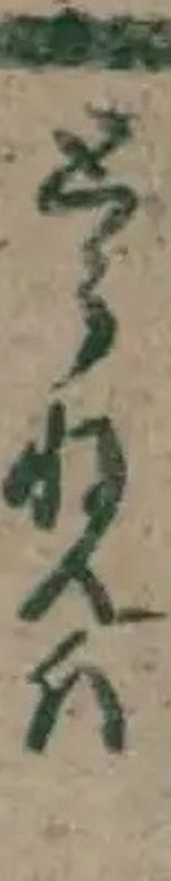とうねんは
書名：頓作時雨月 3巻
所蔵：国立国会図書館 National Diet Library, JAPAN
